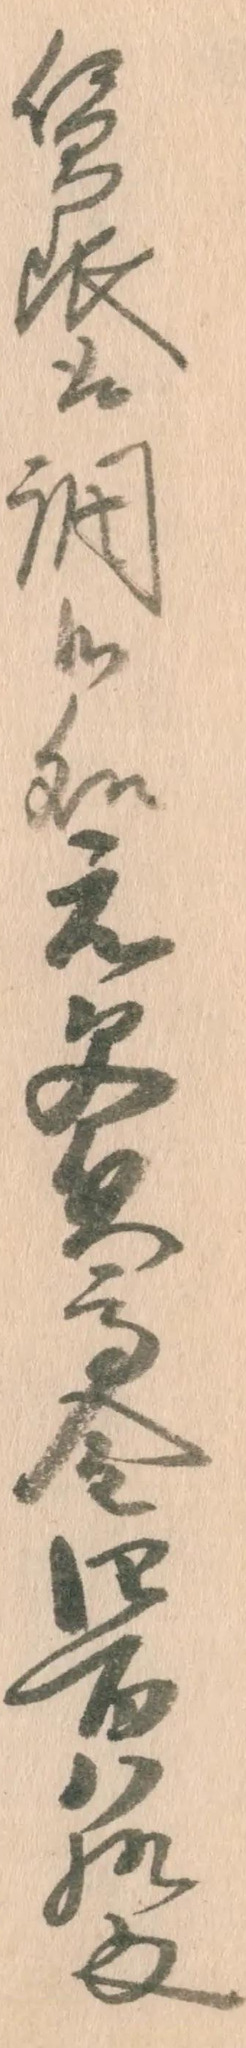賃銀取調候処元受負高金四百八拾両
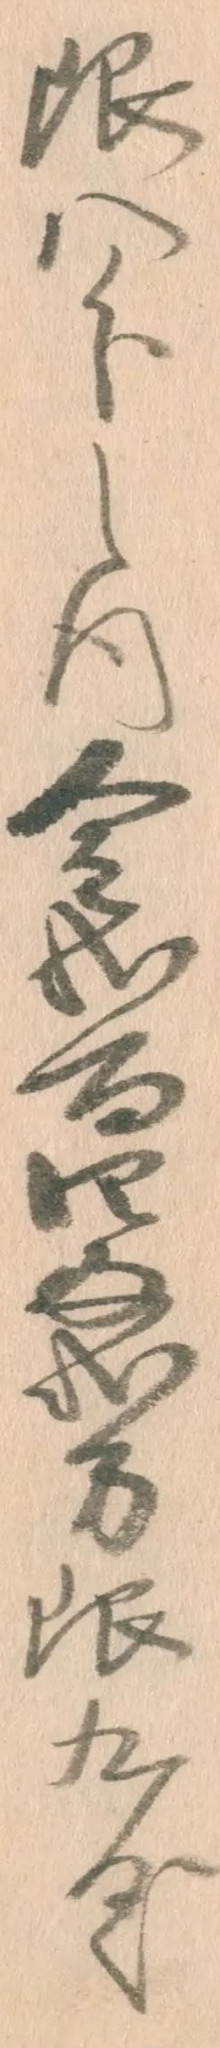銀八分之内金弐百四両弐分銀九匁

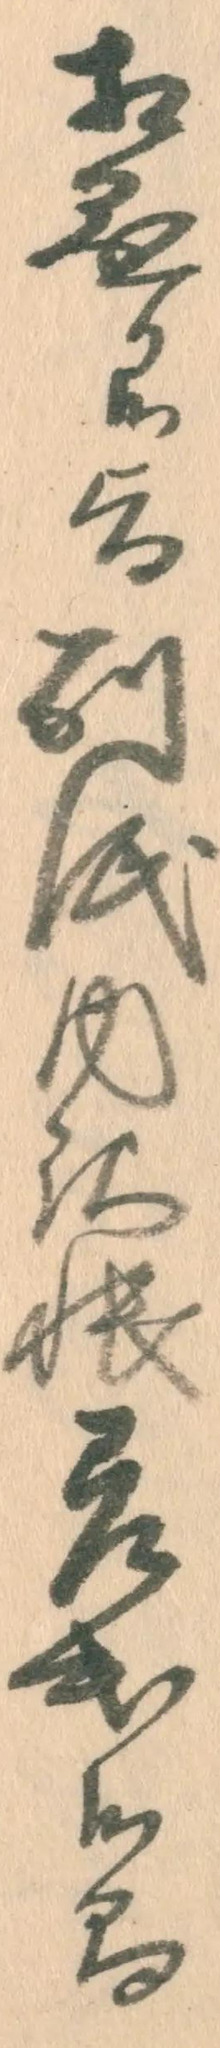相懸り候旨別紙内訳帳差出候間
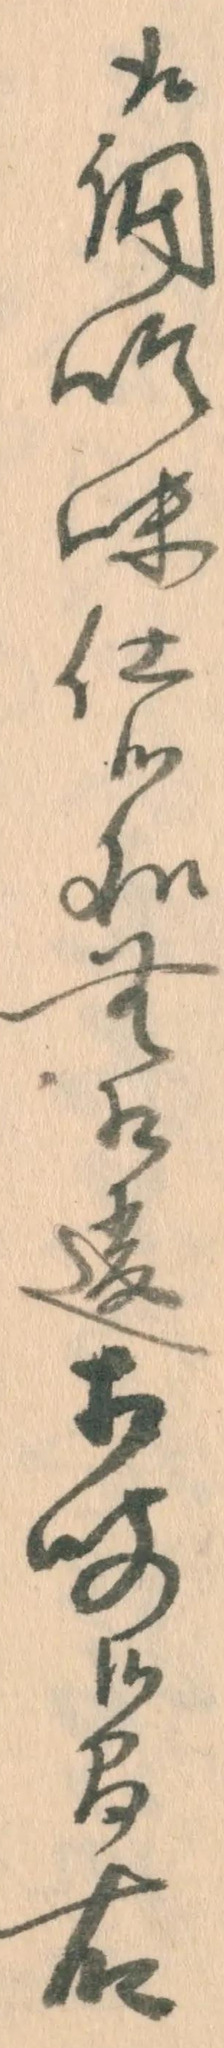取調吟味仕候処無相違相聞候間右
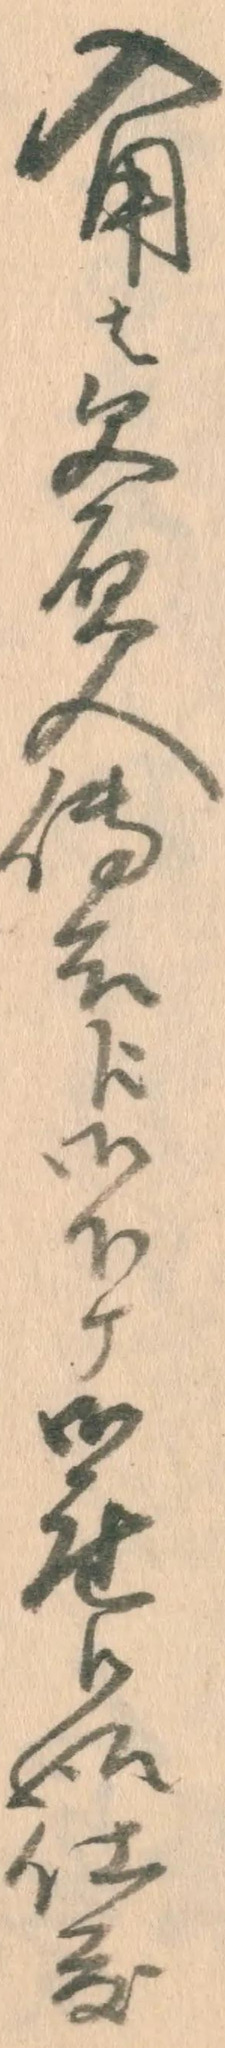入用は受負人伝吉え御下ヶ御座候様仕度
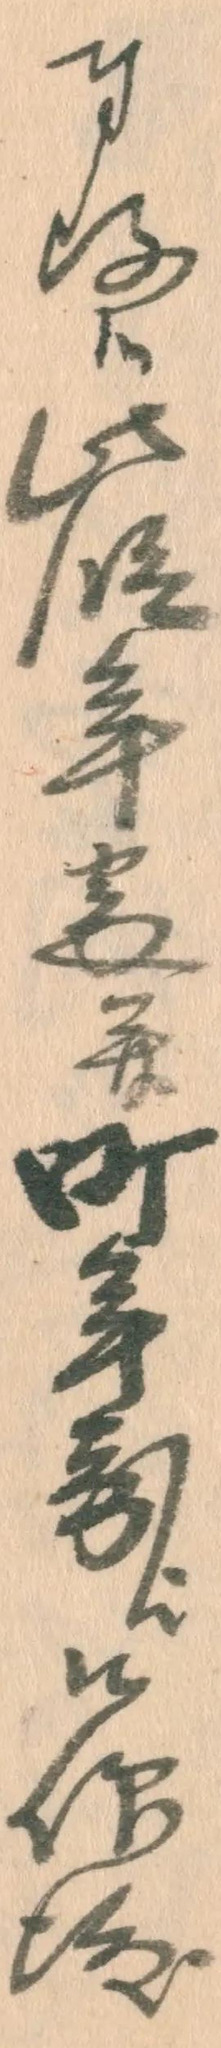奉存候此段年番幷町年寄え被仰渡
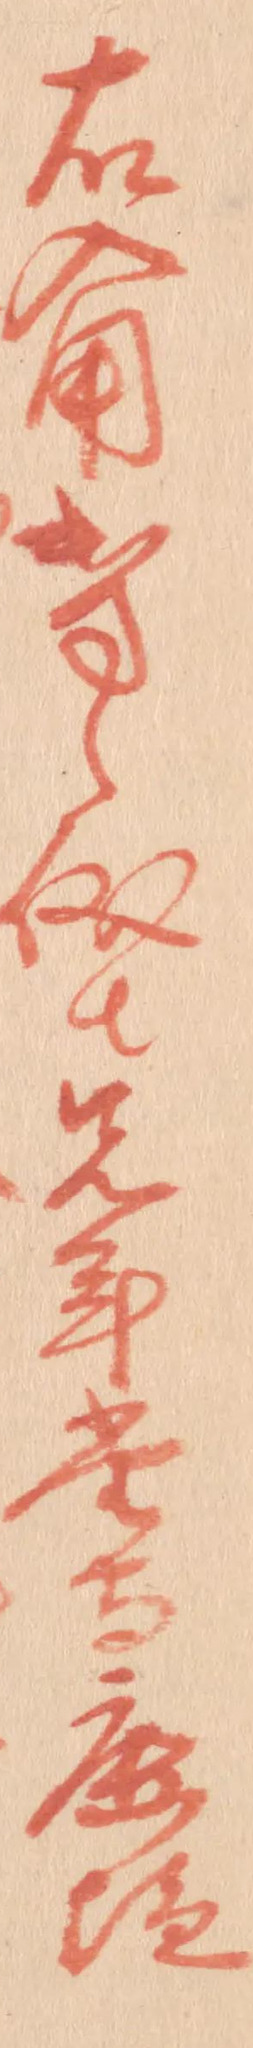「右入用出方之儀は先年堂守鹿塩
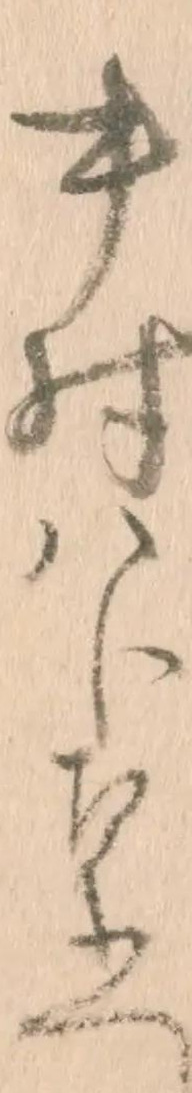中村八郎左衛門

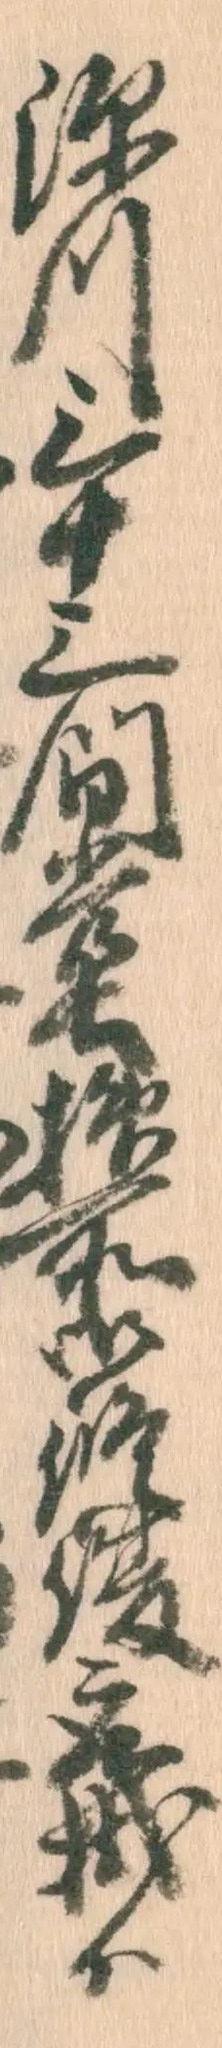深川三十三間堂損所御修復取掛候
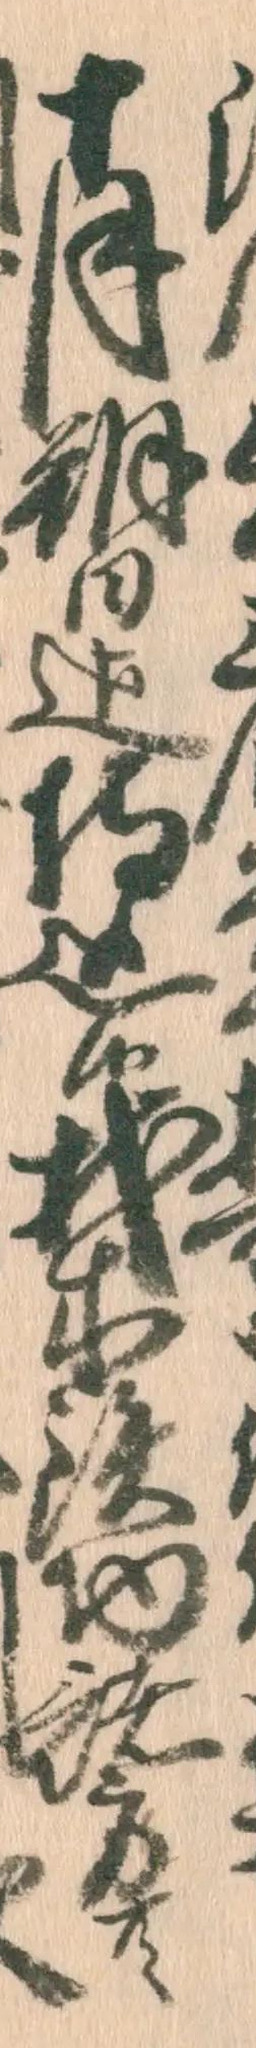十月朔日迄持込候材木鉄物諸方共
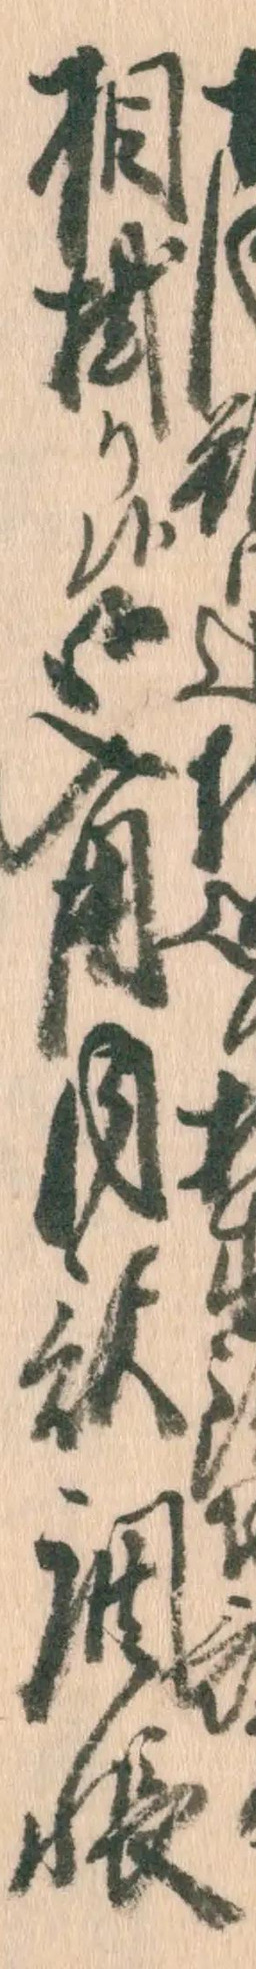相掛り候御入用内訳調帳

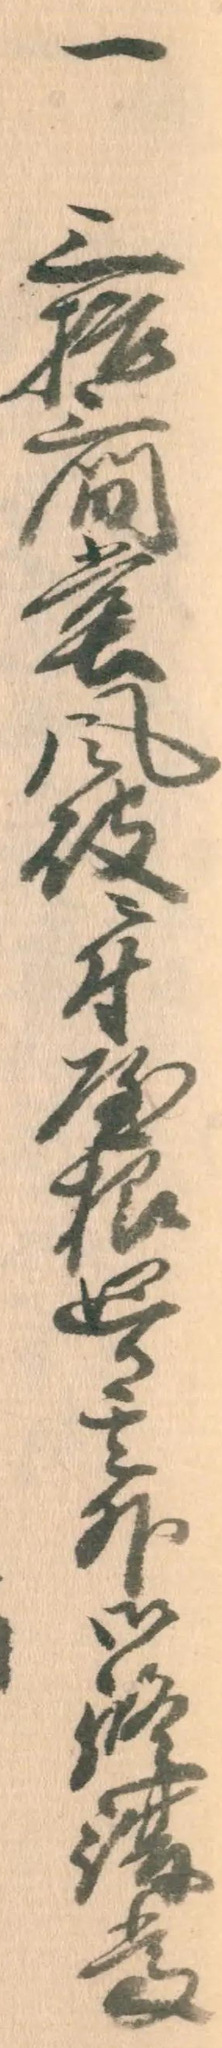一三拾三間堂風破に付屋根廻り其外御修復当
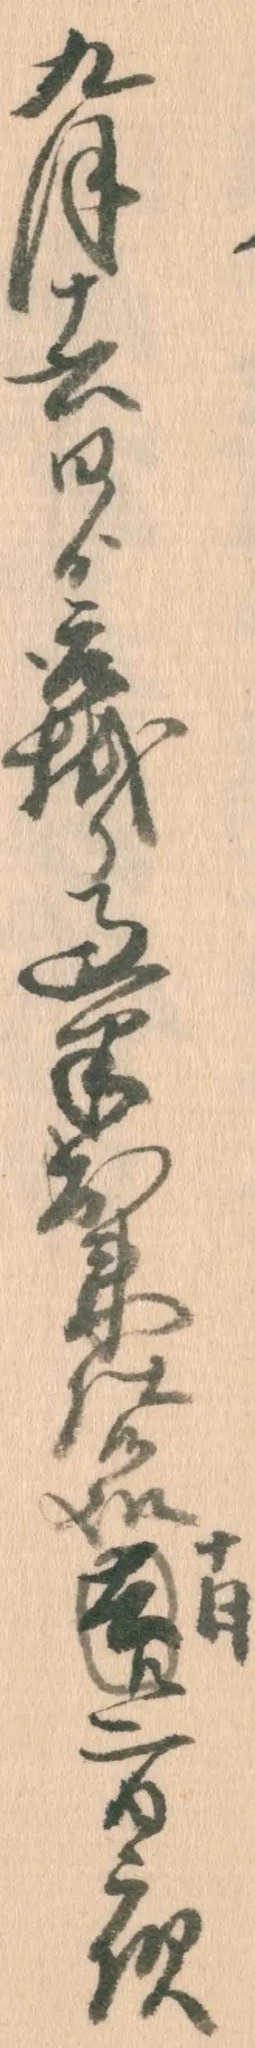九月十六日ゟ取掛り過半出来仕候処十月二日夜
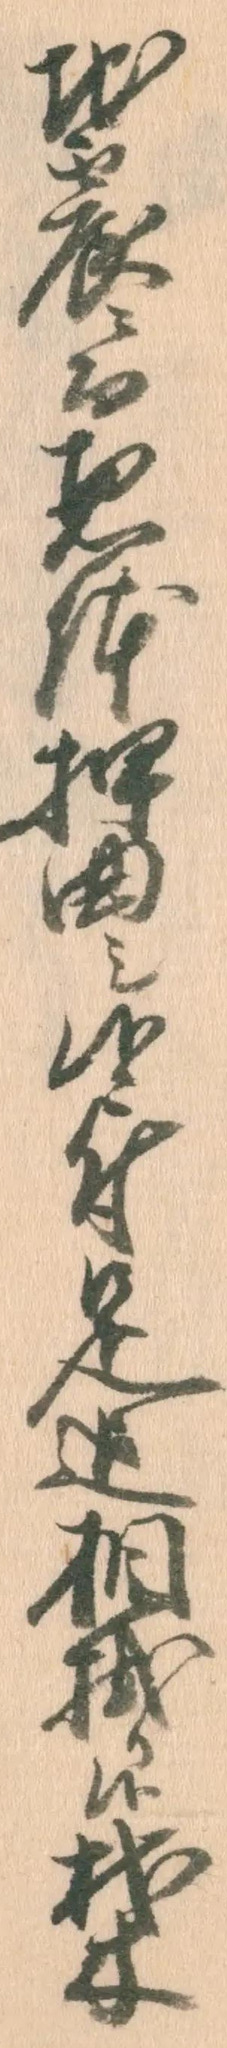地震に而惣体押曲み候に付是迄相掛り候材木
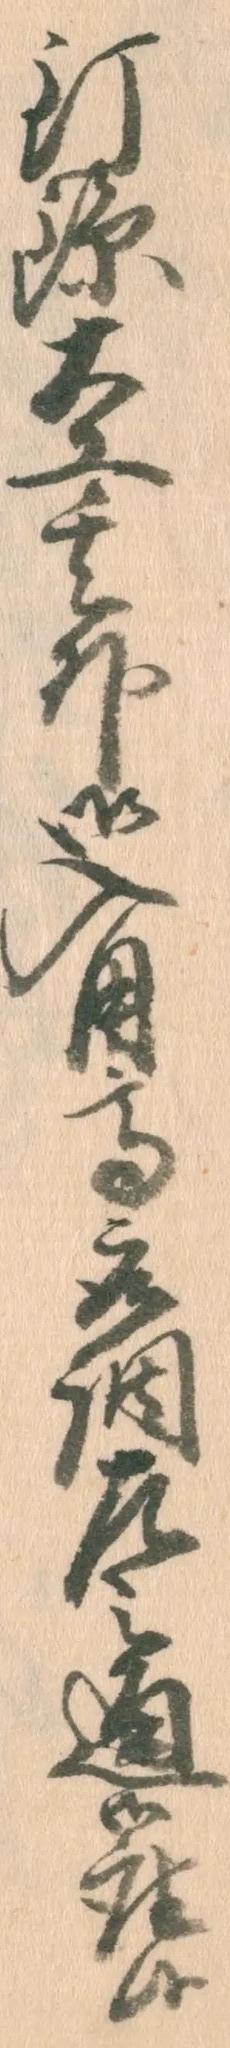釘銯大工其外御入用高取調左之通御座候
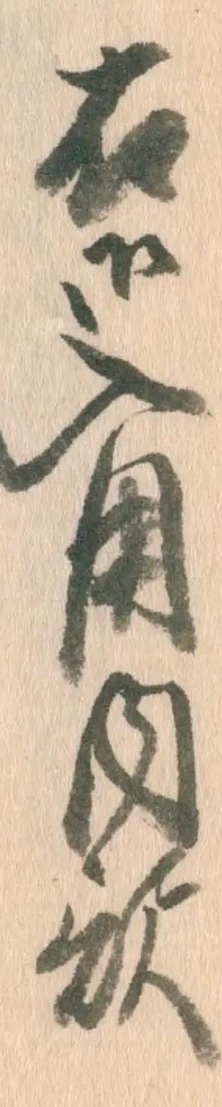右御入用内訳
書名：三十三間堂. [1]
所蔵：国立国会図書館 National Diet Library, JAPAN
